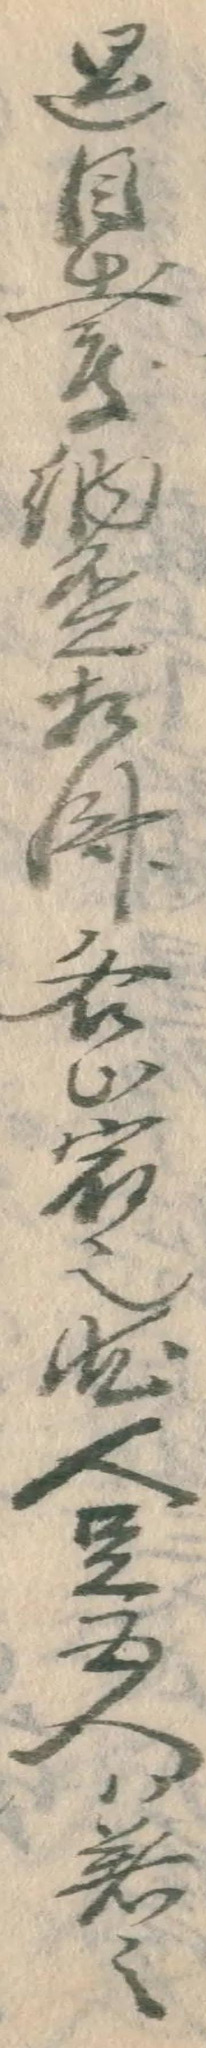過目出度納盃相済各止宿也尤人足五人ハ着之
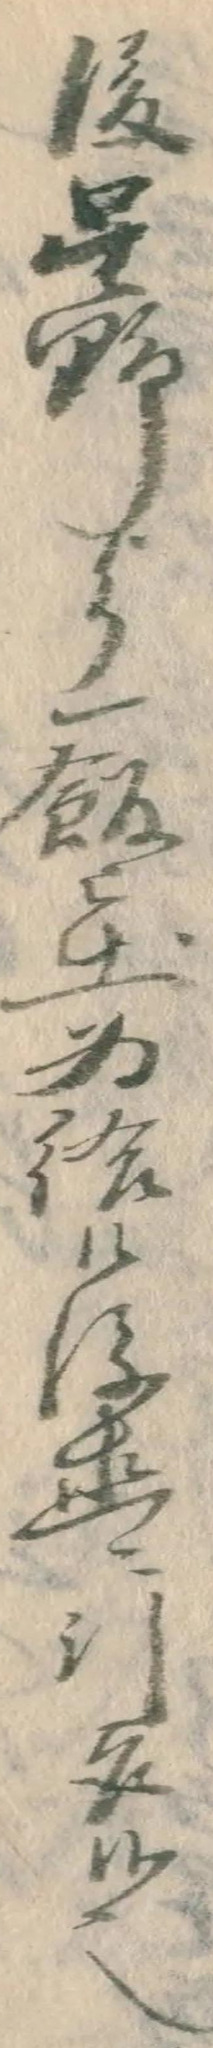後星野より一飯被出為給候後直ニ引取候也
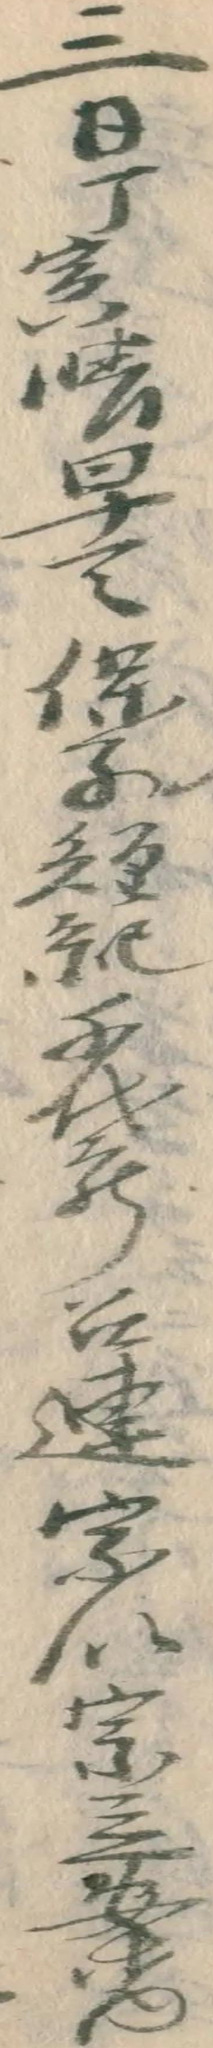三日丁寅晴早天保子経紀千代蔵召連家以宗立案内
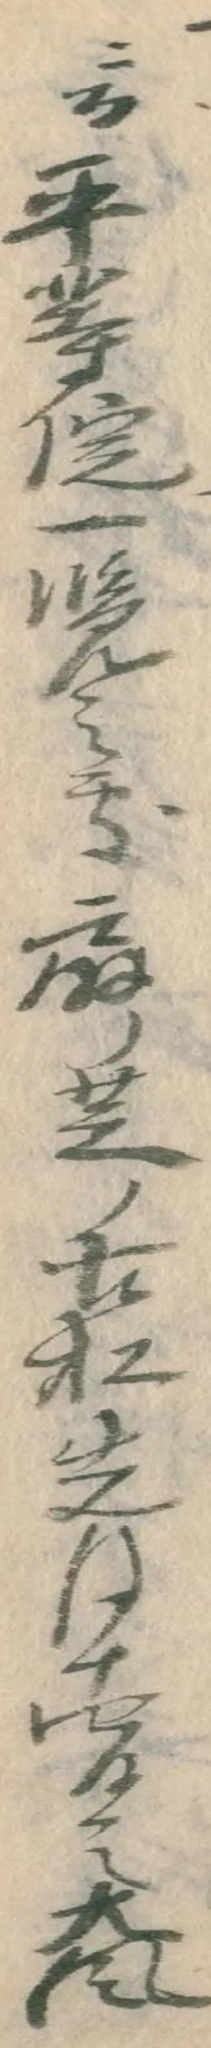ニ而平等院一覧之處扇ノ芝ノ古松先月十四日之大風

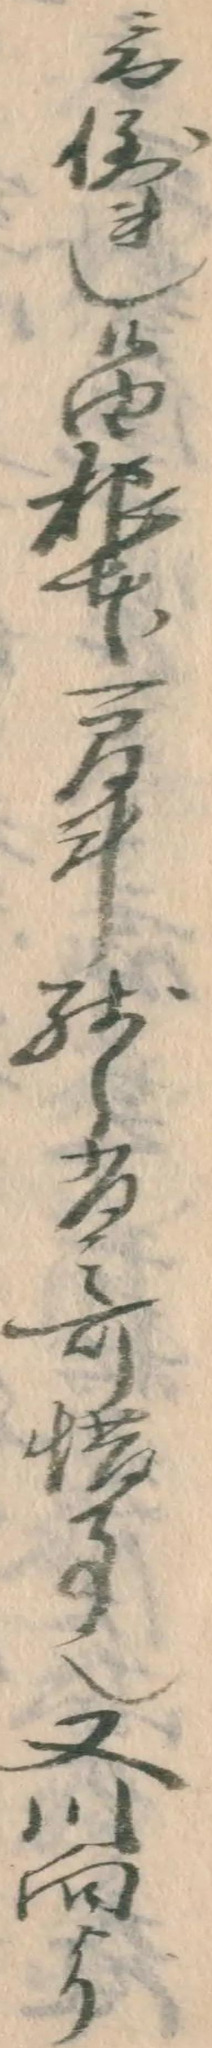ニ而倒れ候由根本一間斗残之有之可惜事也又川向より
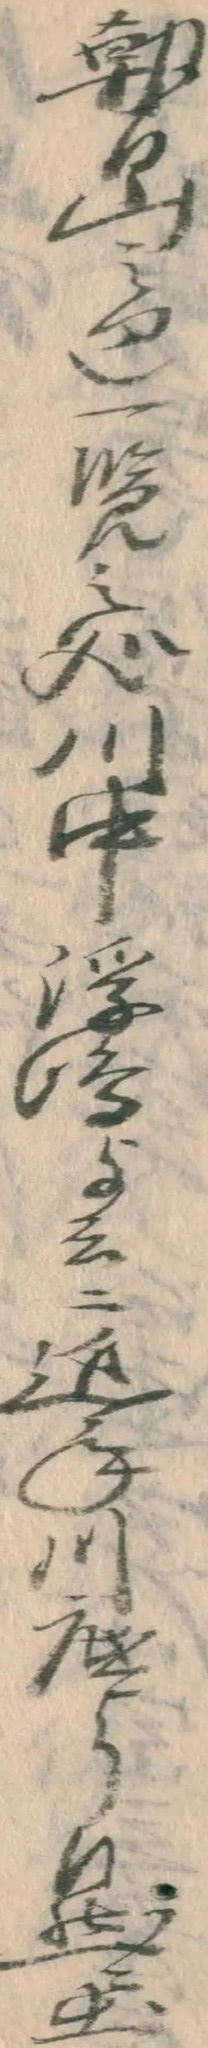朝日山之辺一覧之処川中浮嶋と云ニ近年川底より自然ニ出
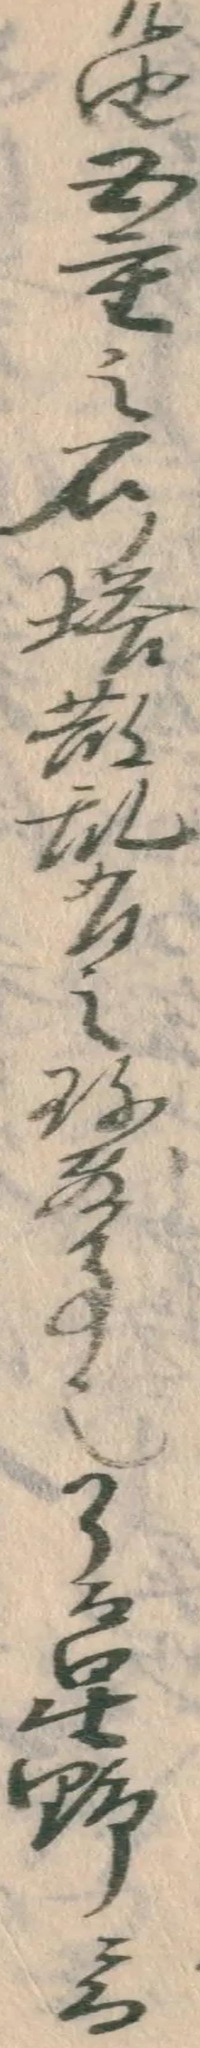候由五重之石塔散乱有之珍敷事也了而星野ニ而
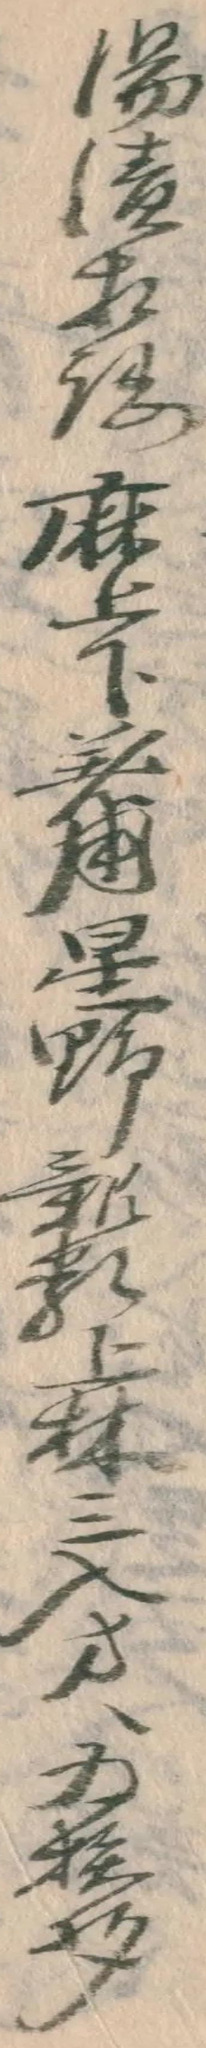湯漬相認麻上下著用星野親類上林三入方へ為挨拶
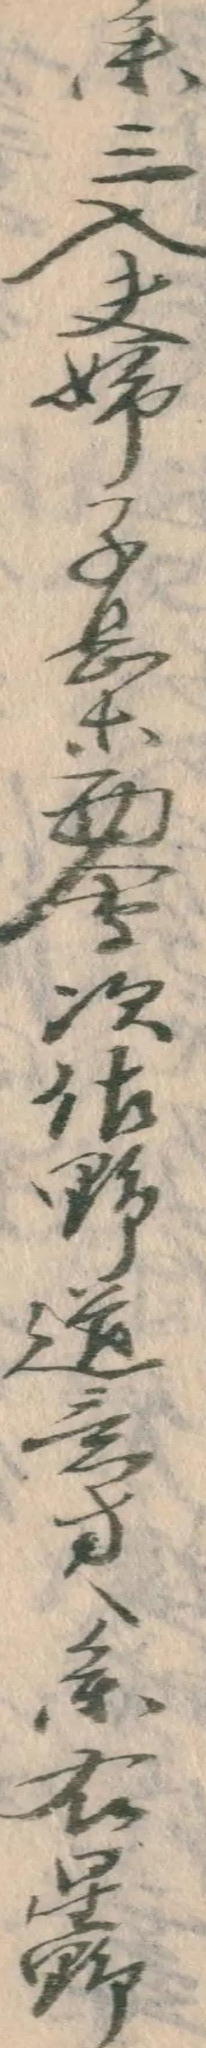参三入夫婦子息等面會次佐野道意方へ参右星野
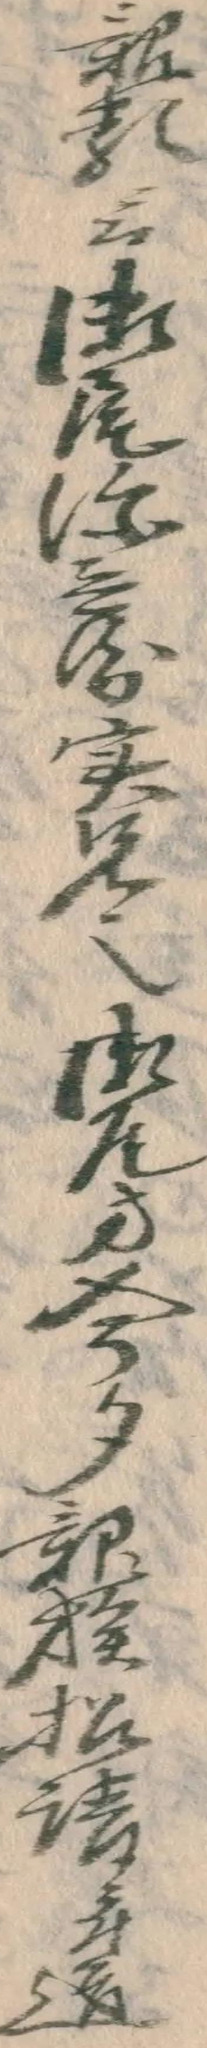親類ニ而瀬尾弥兵衛実兄也瀬尾方今夕親族招請ニ付道
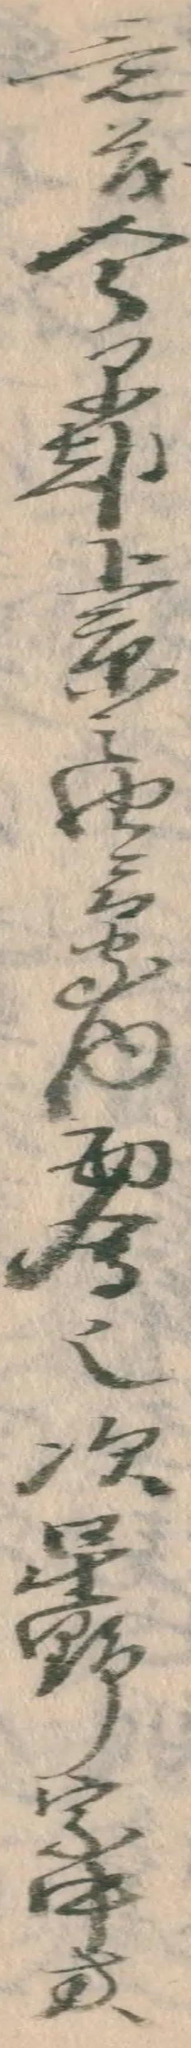意も今早朝上京之由ニ而家内面會也次星野宗中方へ
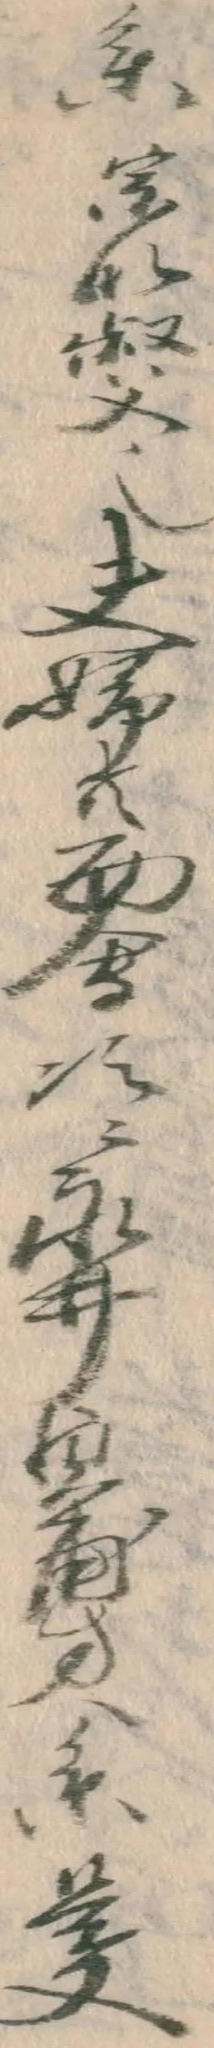参宗以叔父也夫婦共面會次に永井貞甫方へ参是又
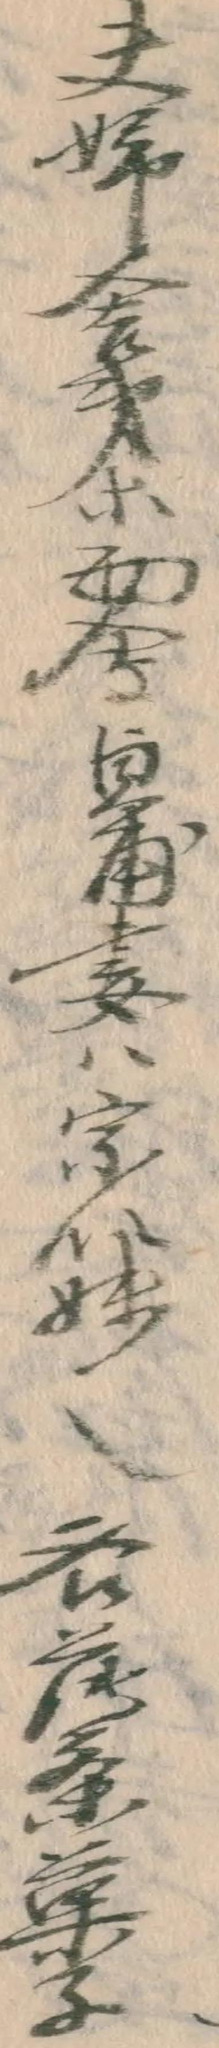夫婦舎弟等面會貞甫妻ハ宗以妹也各落茶菓子
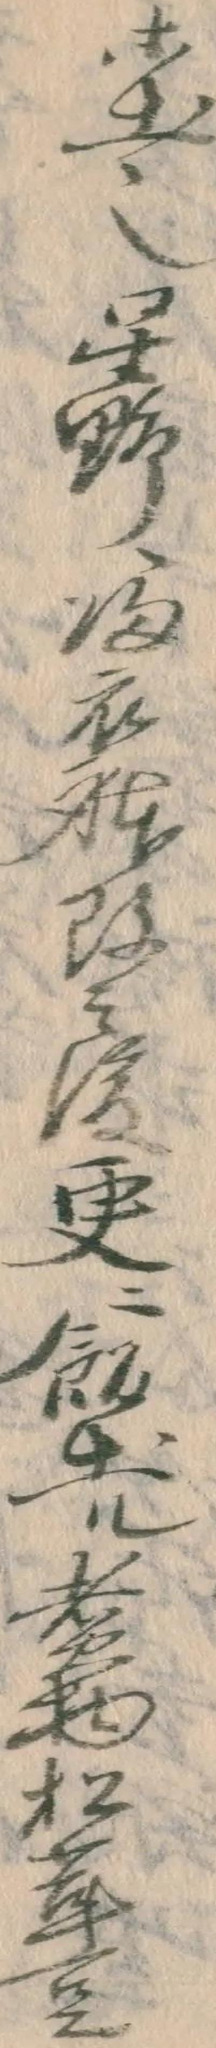等出也星野へ帰衣躰改之後更ニ飯出ル煮物松茸豆
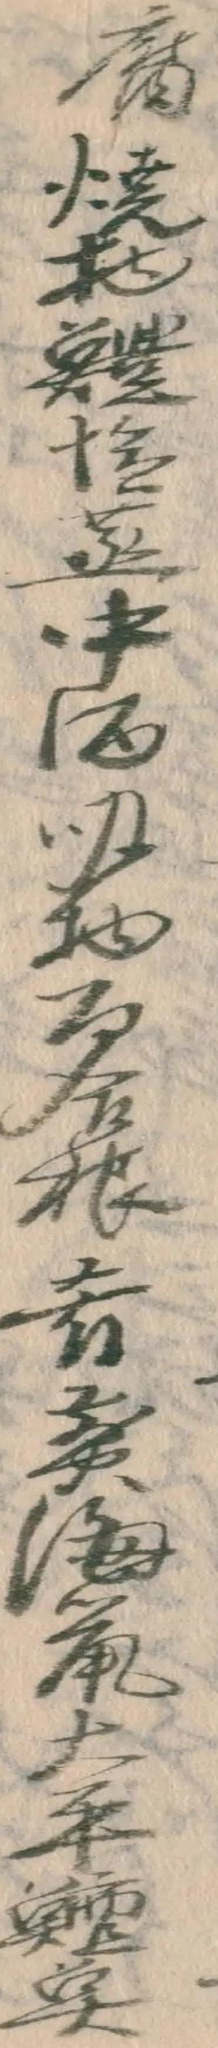腐焼物鱧塩蒸中酒吸物百合根肴蒸海鼠大平䱰魚
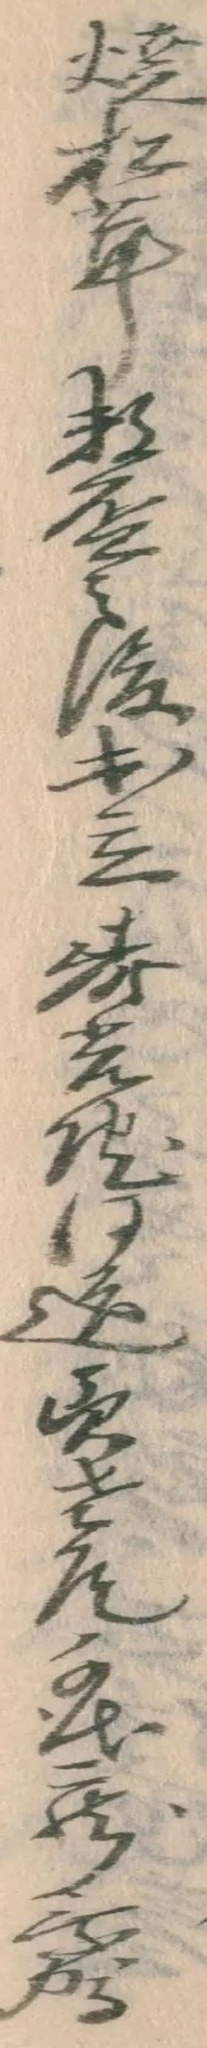焼松茸数盃之後出立壽光院同道みさお千代蔵無駕
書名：賀茂社記録. 第67冊
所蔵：国立国会図書館 National Diet Library, JAPAN
